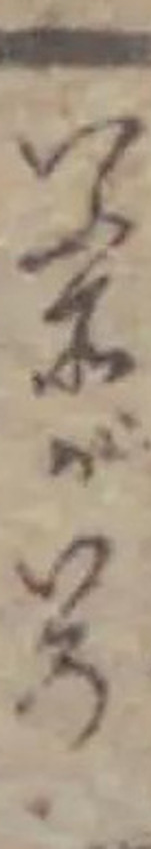いふ所がいろ
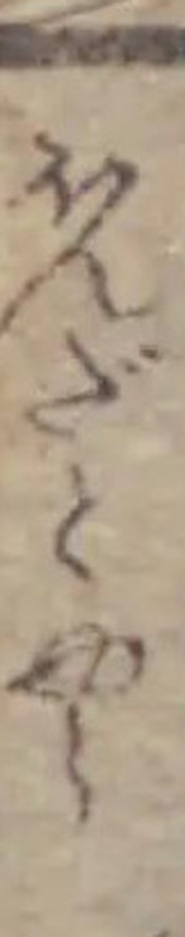ほんだとやら
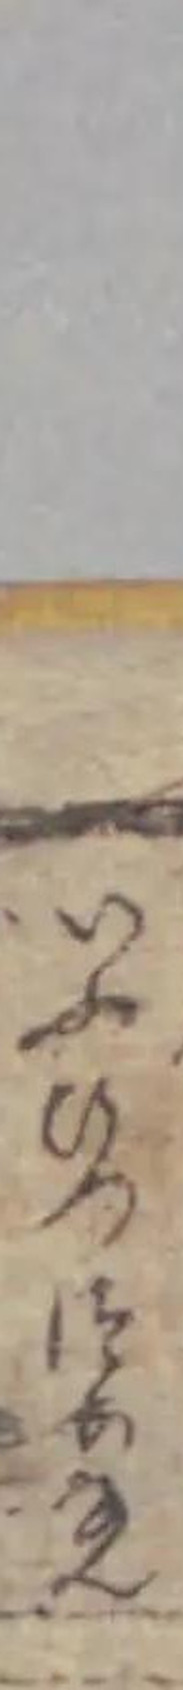いふひつつめなん
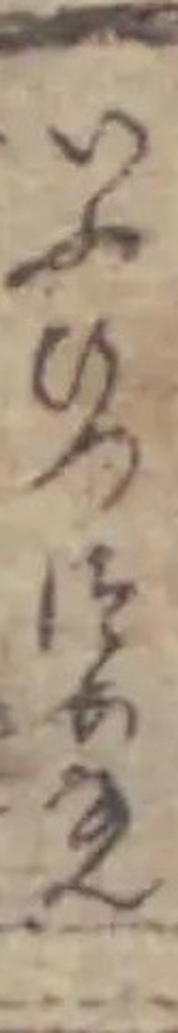いふひつつめなん
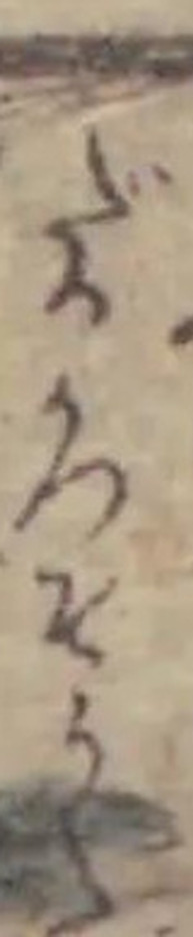だかかつそうた
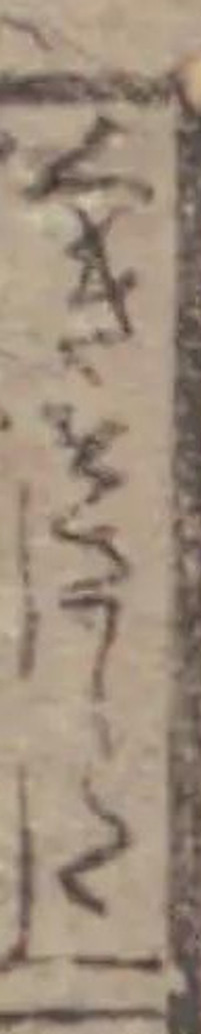くきをさした
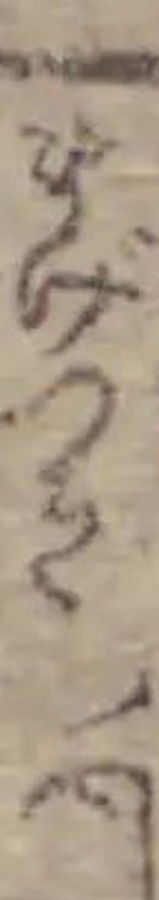まげつき
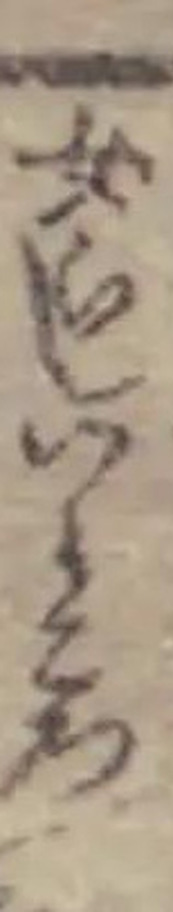女らしいところ
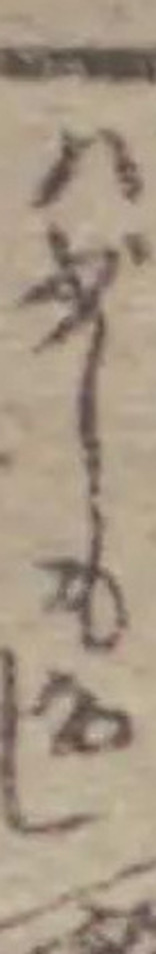は少しもなし
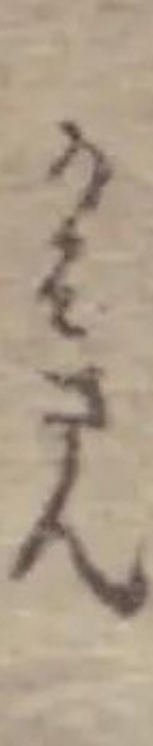かみさん
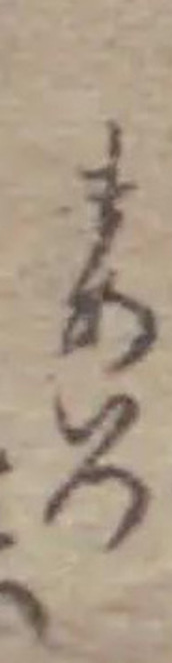まあいつ
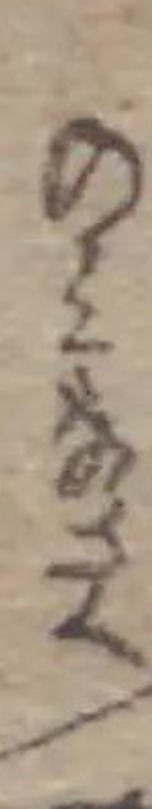のみなさへ
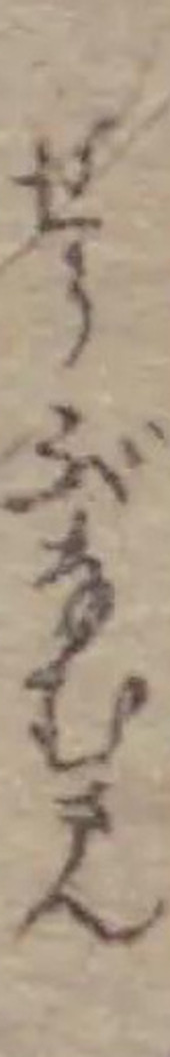せうぶなむさん
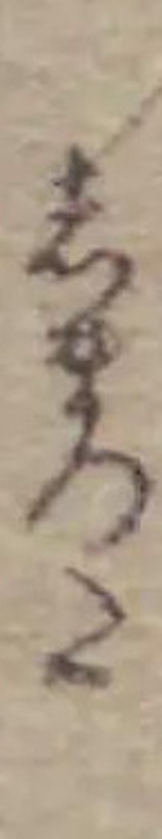しまつた
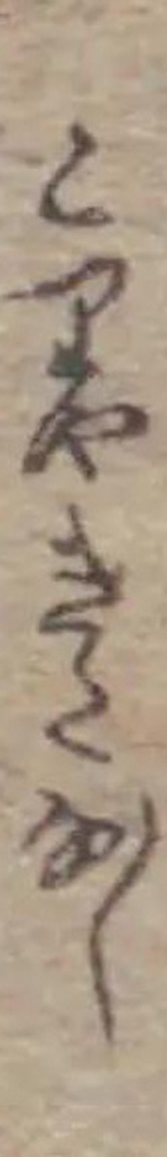こりやきたな〳〵
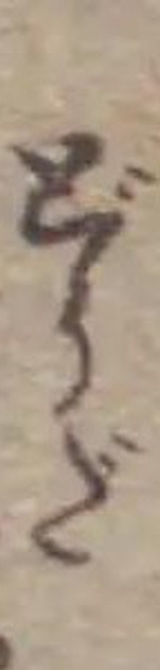どうだ
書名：飛た間違矢口噂 2巻
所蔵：国立国会図書館 National Diet Library, JAPAN
